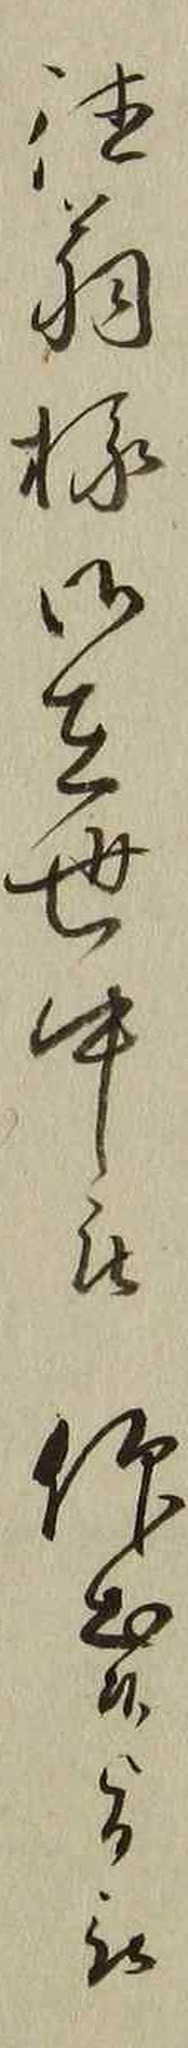徳翁様御在世中被仰出候旨被
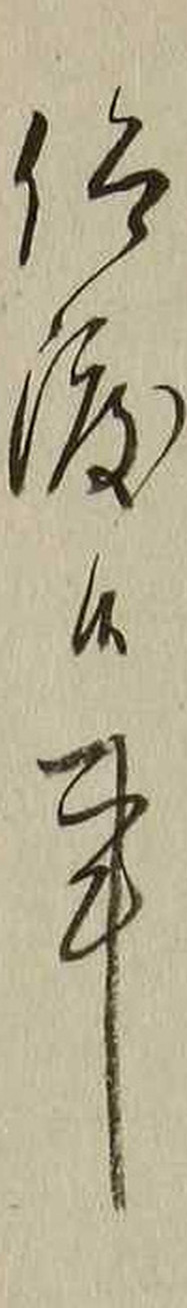仰渡候事
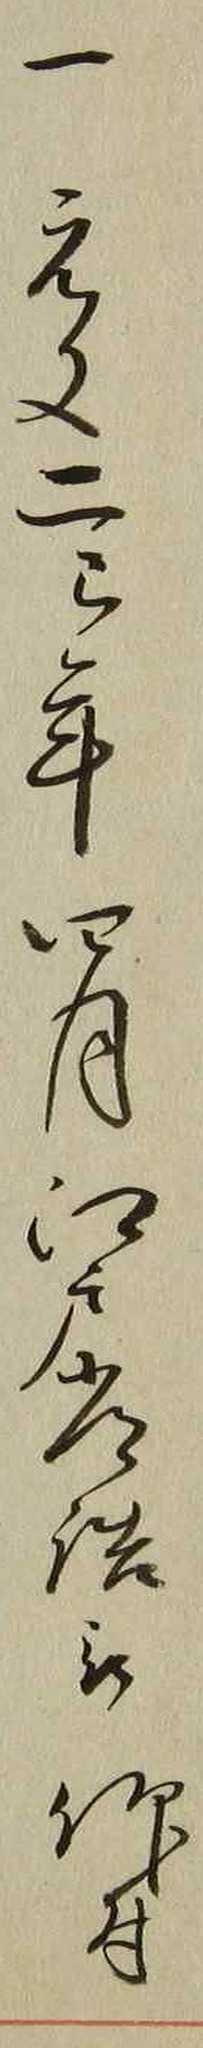一元文二巳年四月江戸常詰被仰付
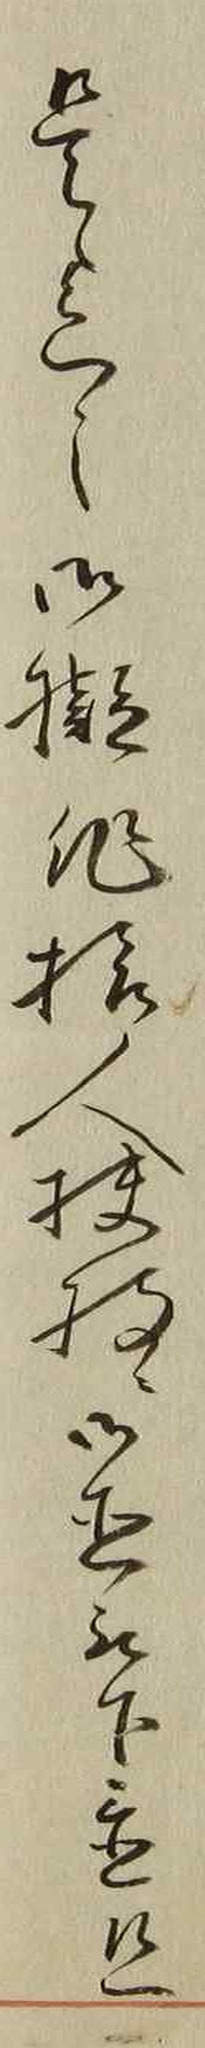是迄之御擬作拾人扶持に御直被下置且
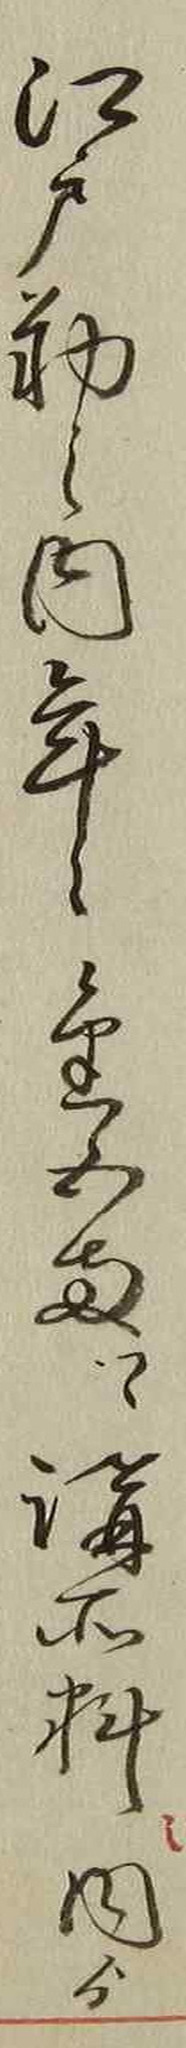江戸勤之内年々金五両ツ丶講所料内ゟ
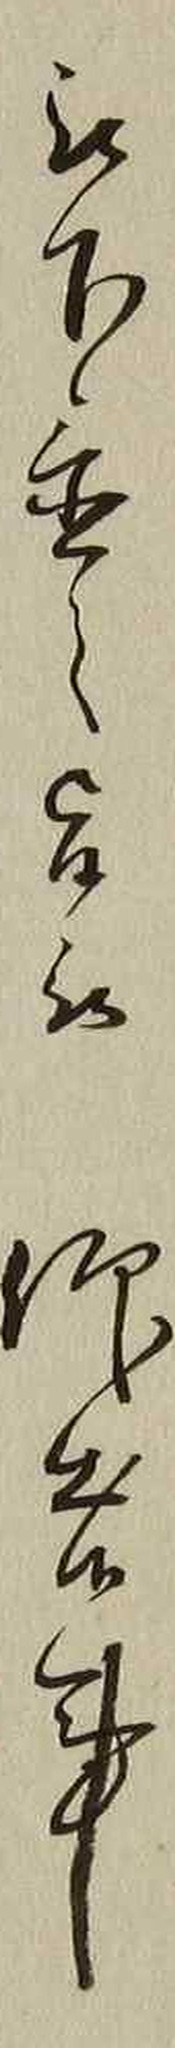被下置之旨被仰出候事
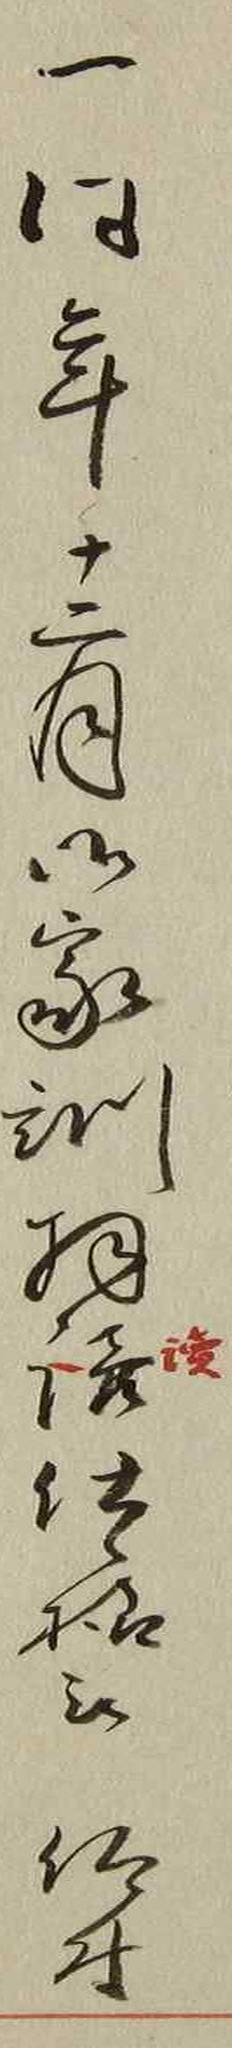一同年十二月御家訓拝仕候様被仰付
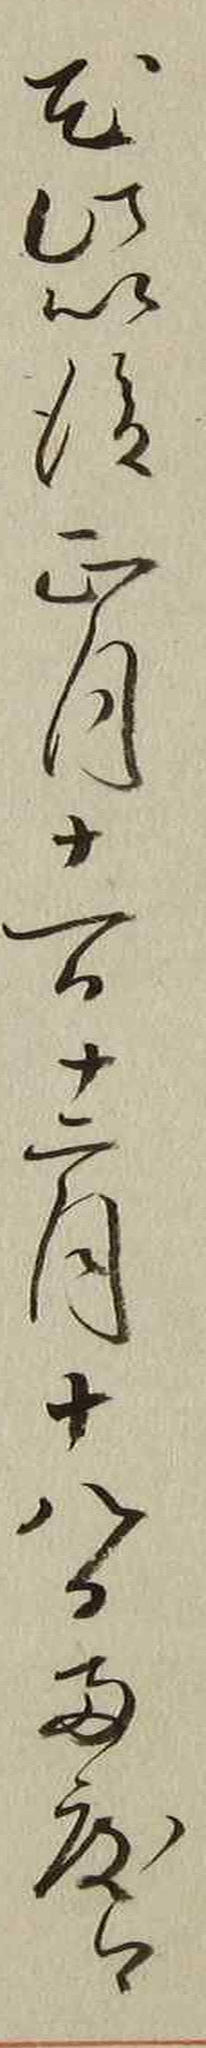尤此以後正月十一日十二月十八日両度ツ丶
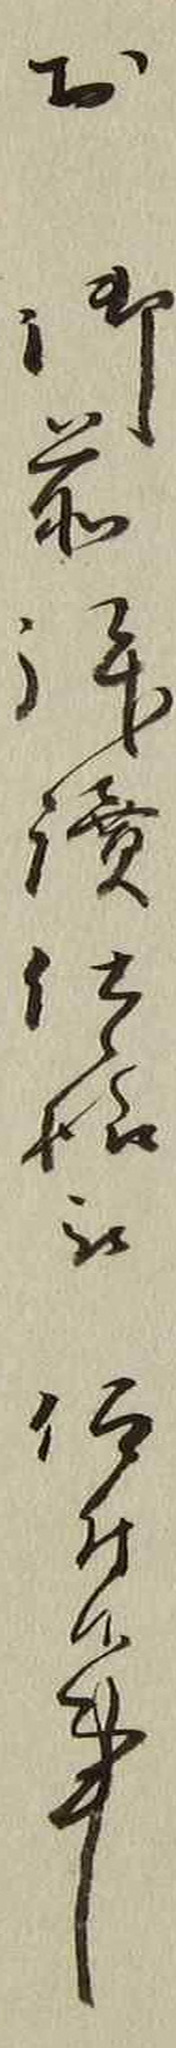於御前拝読仕候様被仰付候事
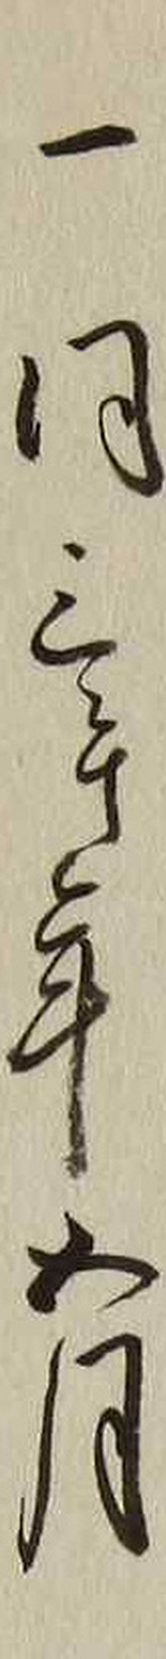一同三午年五月
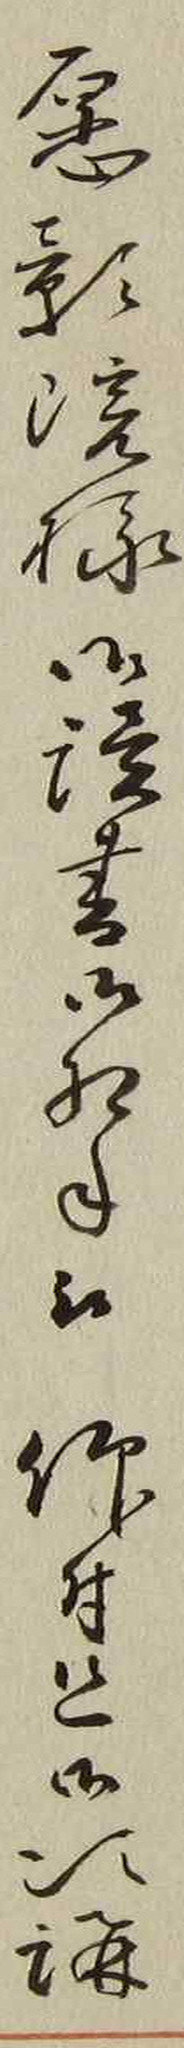愿彰院様御読書御相手被仰付且御次講
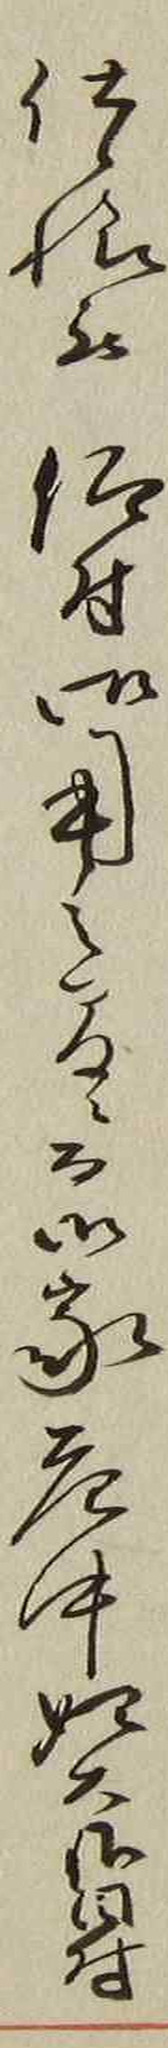仕候様被仰付御用之間に而御家老中始大御目付
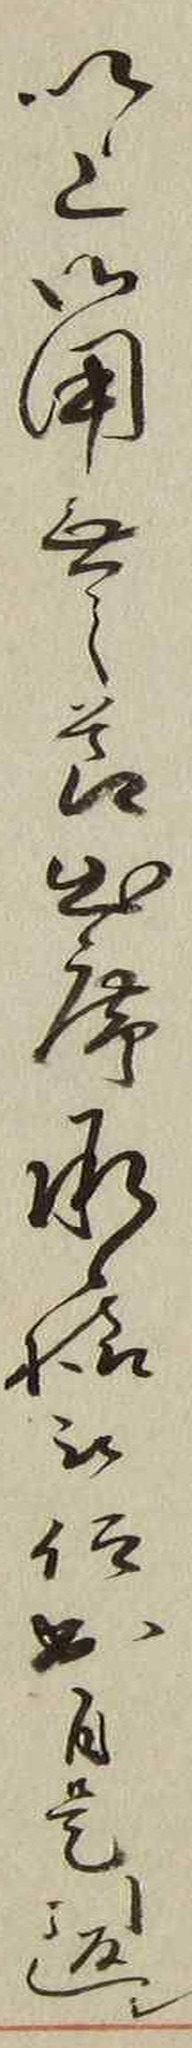以上御用無之節出席承候様被仰出自是引返し
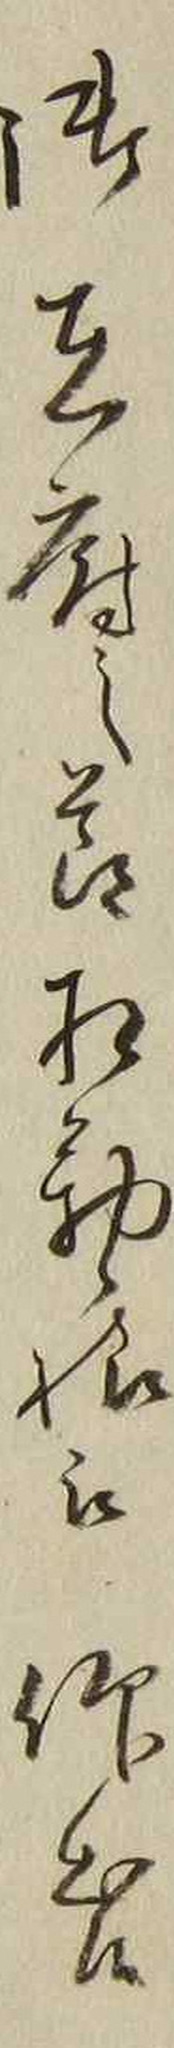御在府之節相勤候様被仰出候

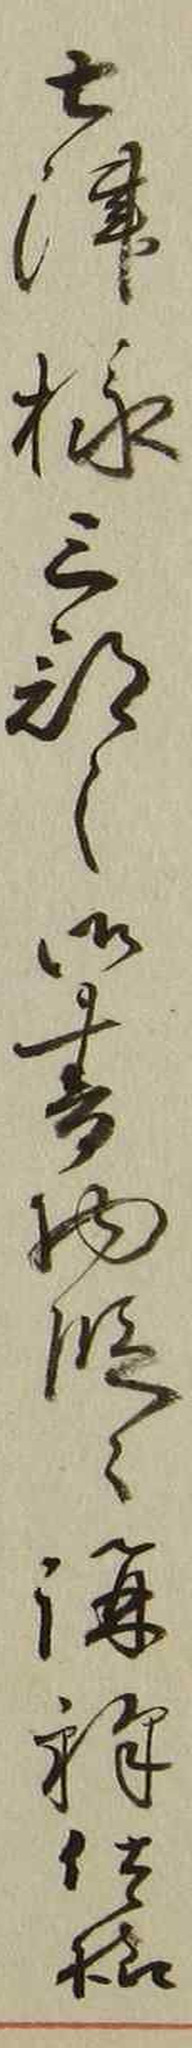土津様三部之御書物段々講釈仕候様
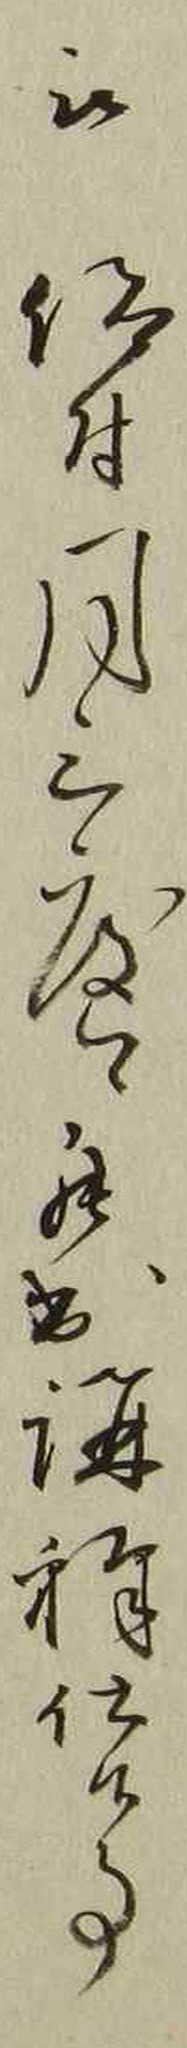被仰付月三度ツヽ罷出講釈仕候事
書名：諸士系譜　巻之3　い之部3
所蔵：会津若松市立会津図書館
